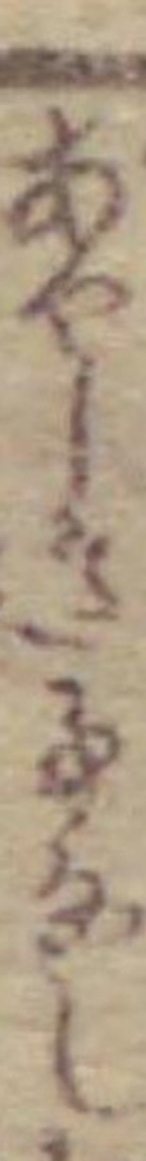あやしき事なし。
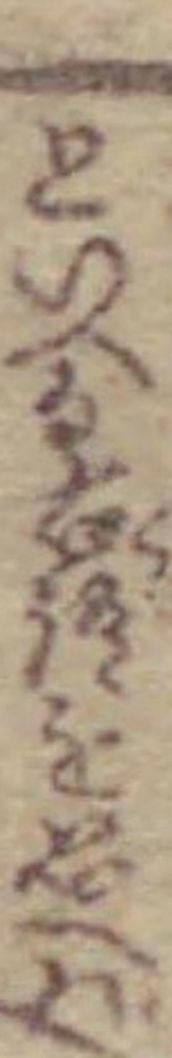といへる古語を思へば
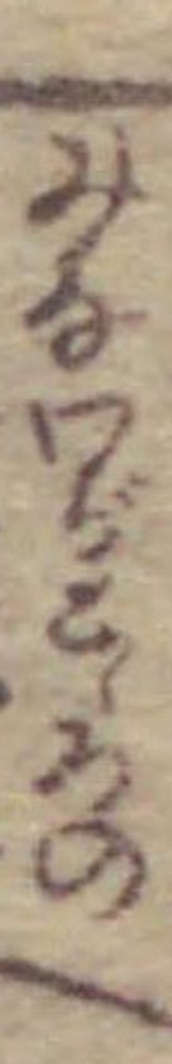みるわかこゝろの
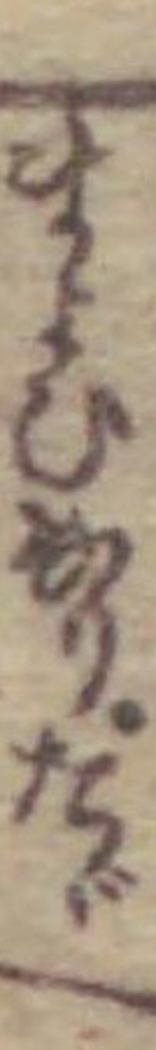まよひなり。たゞ
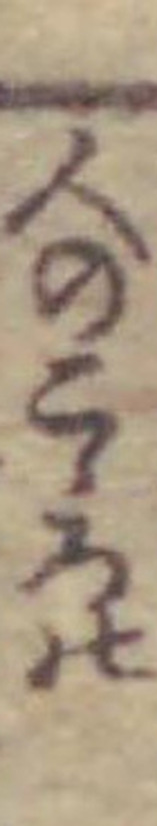人のこゝろの
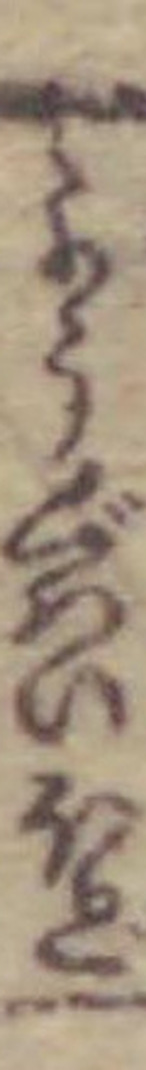ようぐはいほど
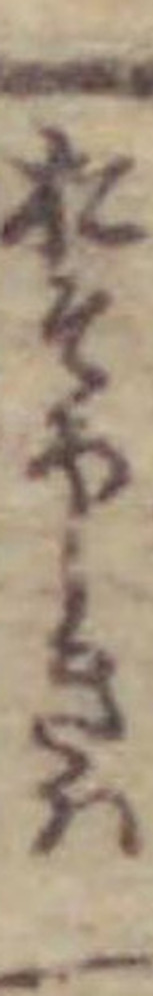おそろしきは
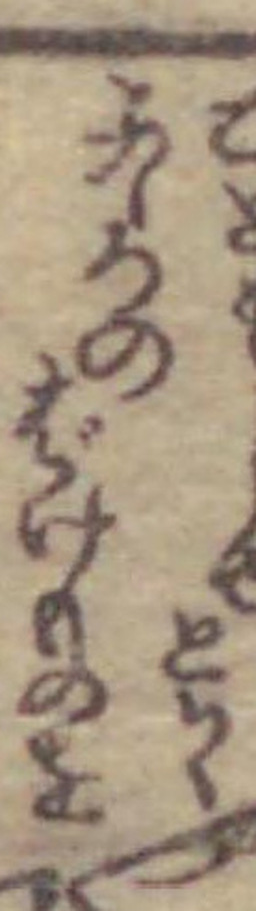こゝろのばけものを
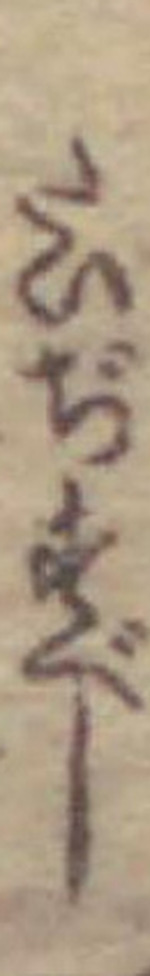たいぢすべし
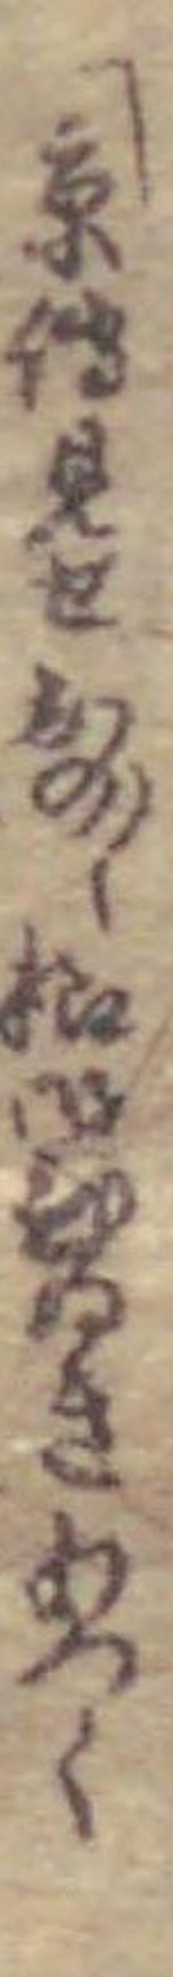〽京伝見世おの〳〵様御ひゐきあつく
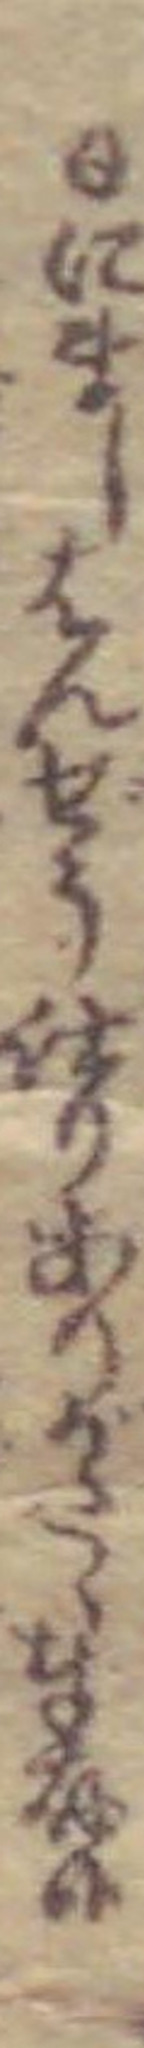日にましはんぜう仕りありがたく奉存候
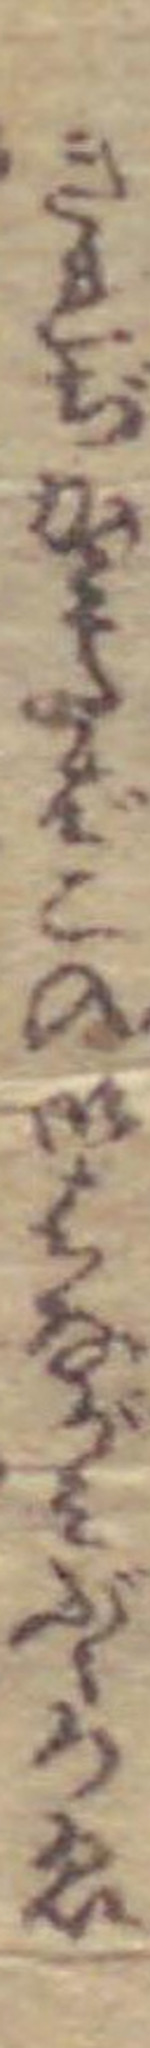きれぢかみたばこの御はながみぶくろゑ
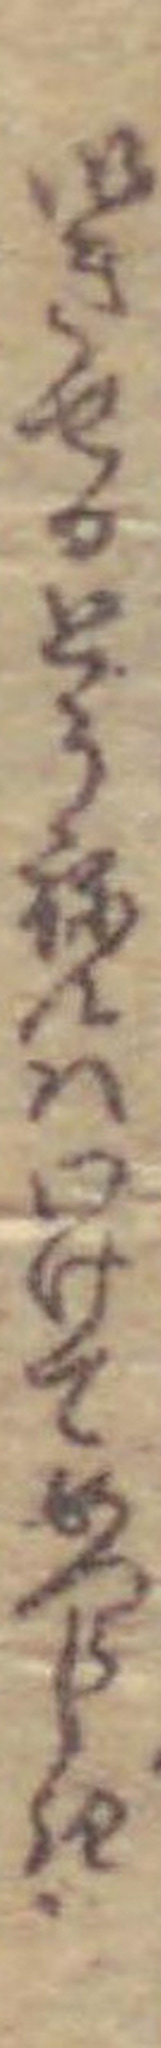御きせるとうねんはわけてめづらしき
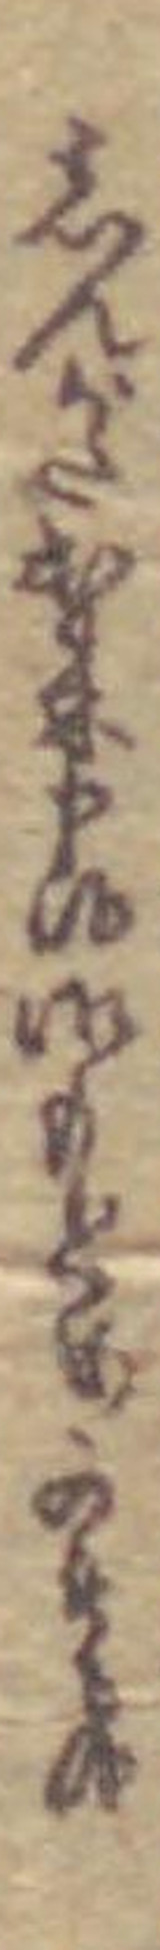しんがた出来申候御もとめ可被下候
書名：化物和本草 : 3巻
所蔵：国立国会図書館 National Diet Library, JAPAN
